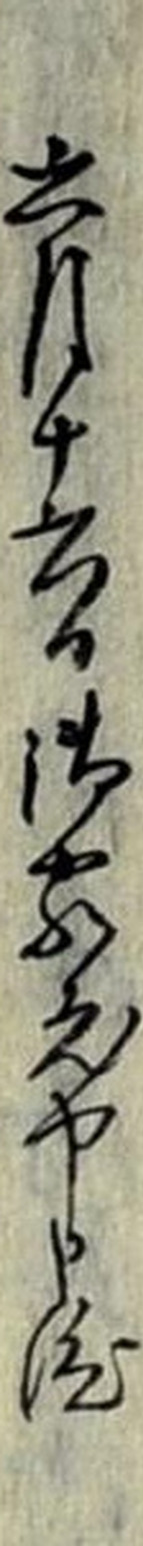六月十六日御家老中申渡
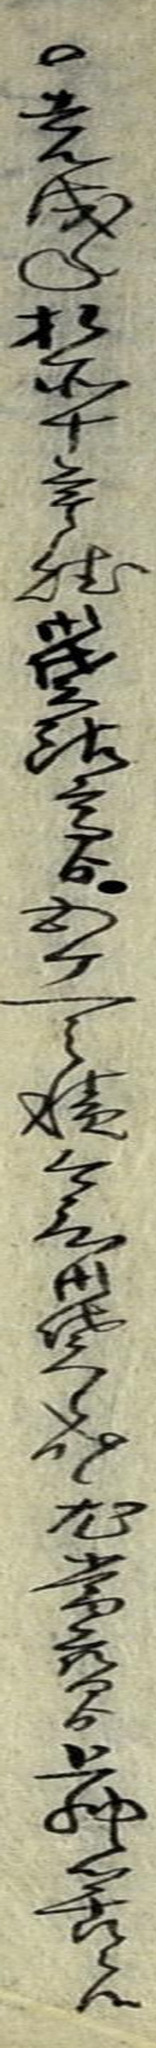〇去ル戌年札所十年賦御貸銀高ゟ五ケ一之積今度御貸被成候尤当暮ゟ上納之筈ニ候
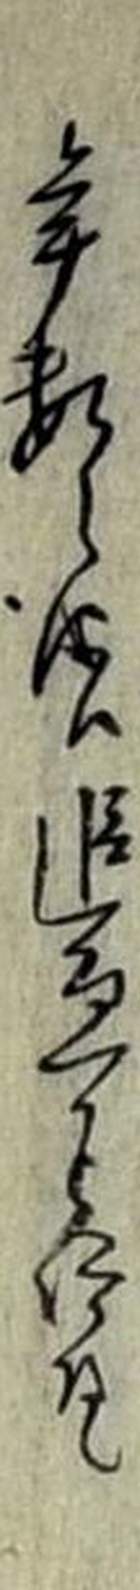年数之儀ハ追而可被仰付候
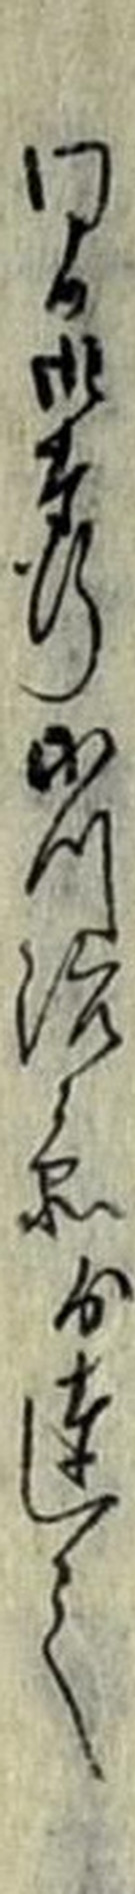同日御奉行小川治兵衛ゟ達之
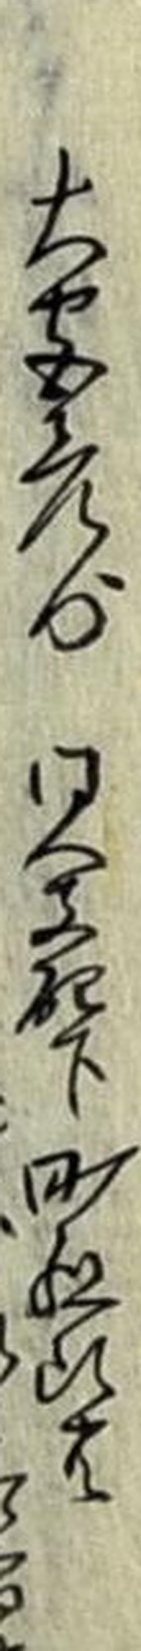大宮彦右衛門同人支配下町組頭共
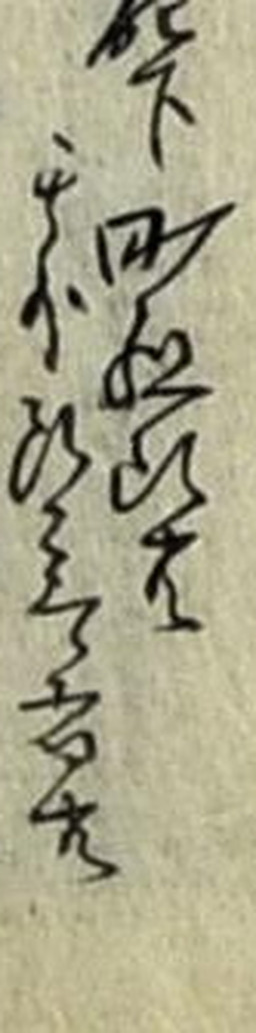其外頭立候者共
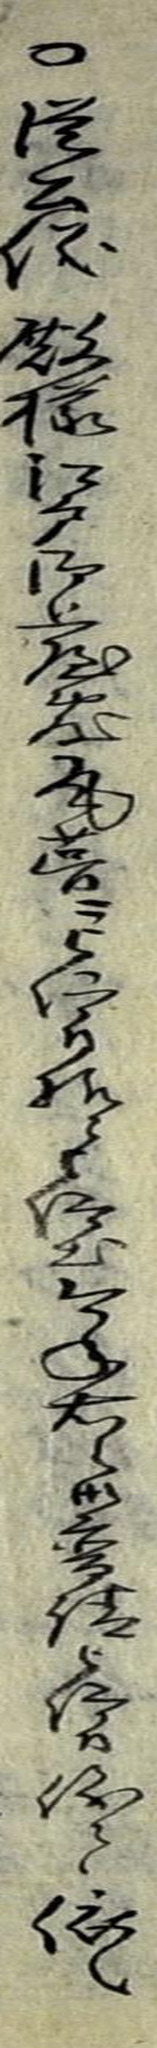〇従公儀殿様江戸御上屋敷瓦葺ニ被仰付様ニ被仰出今年右之御普請被仰付儀ニ候依之
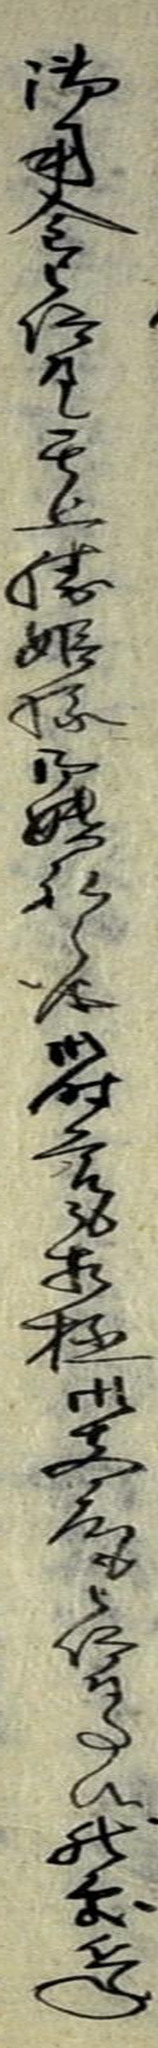御用金被仰付候其上勝姫様御婚礼之儀御時節も相極御支度も被仰付事候然処近年
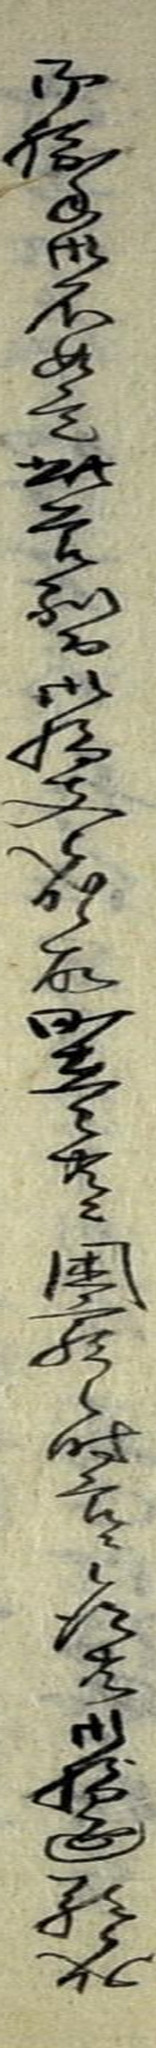御勝手御不如意此節別而御指支被成候故町在々共ニ困窮之時節ニ候得共御指延難被成
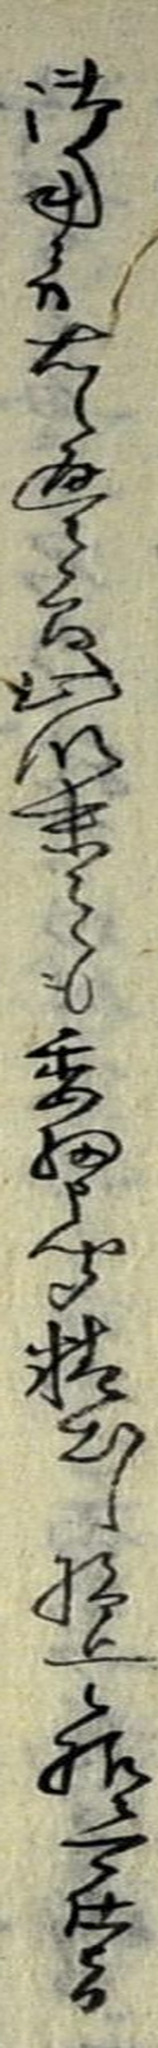御用ニ付右之通ニ候間此段末々へも委細申聞精出し指上候様ニ可仕旨
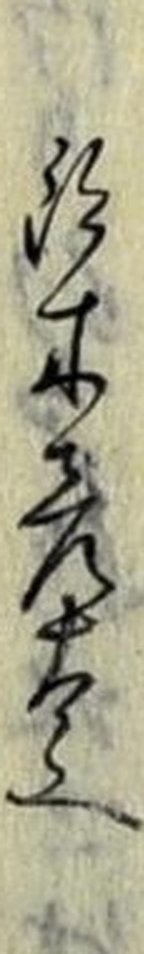鈴木彦大夫
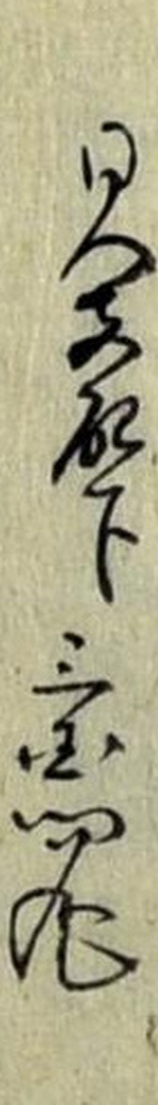同人支配下三国問丸
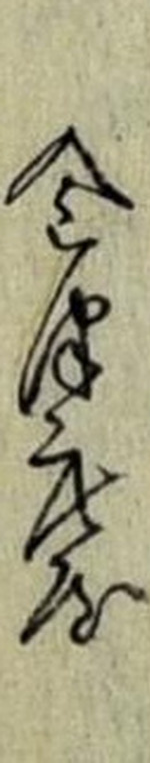金津庄屋
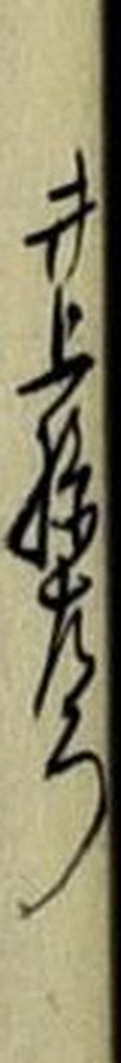井上孫左衛門
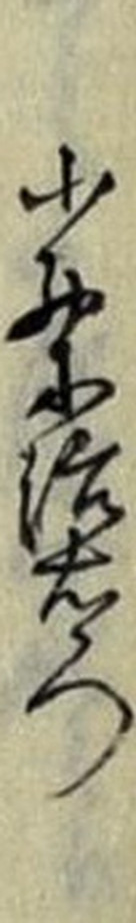小栗治右衛門
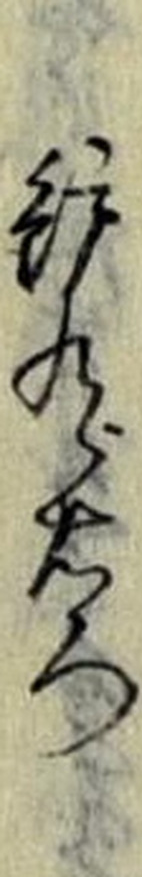鱸九郎右衛門
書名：命令之部 一
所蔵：福井県文書館 Fukui Prefectural Archives
